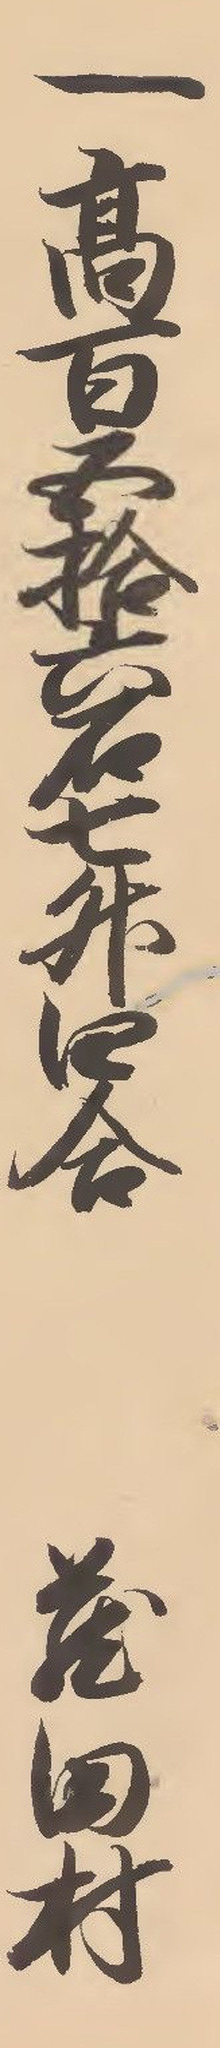一高百五拾六石七升四合蔵田村
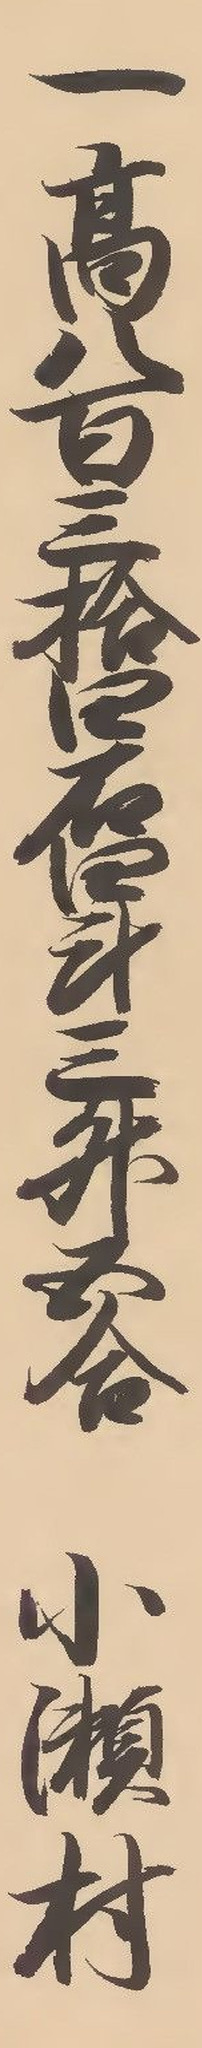一高八百三拾四石四斗三升五合小瀬村
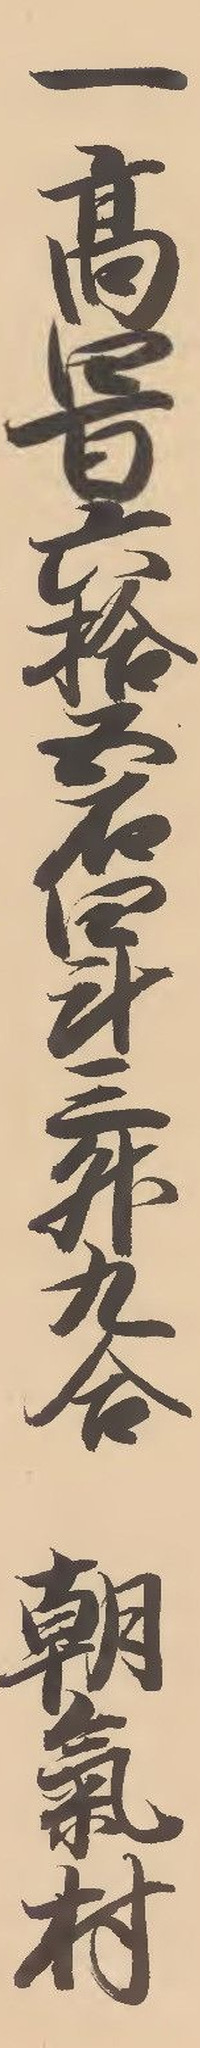一高四百六拾五石四斗三升九合朝気村
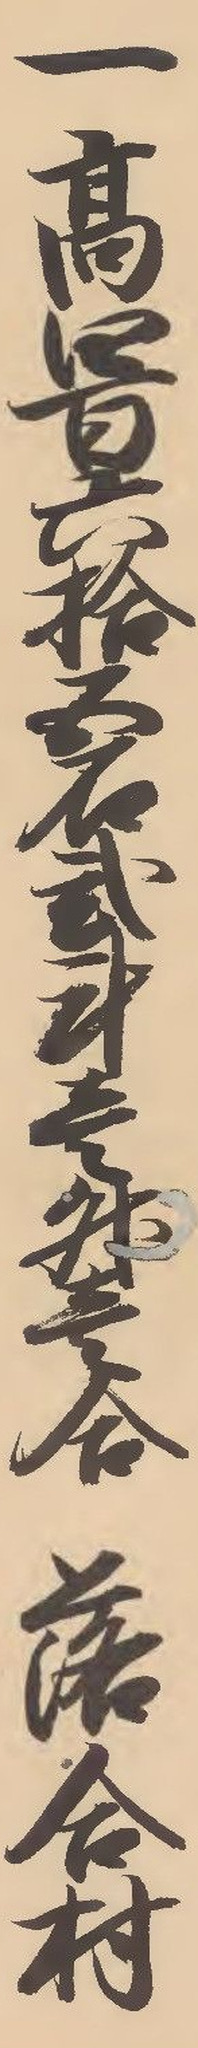一高四百六拾五石弐斗壱升壱合落合村

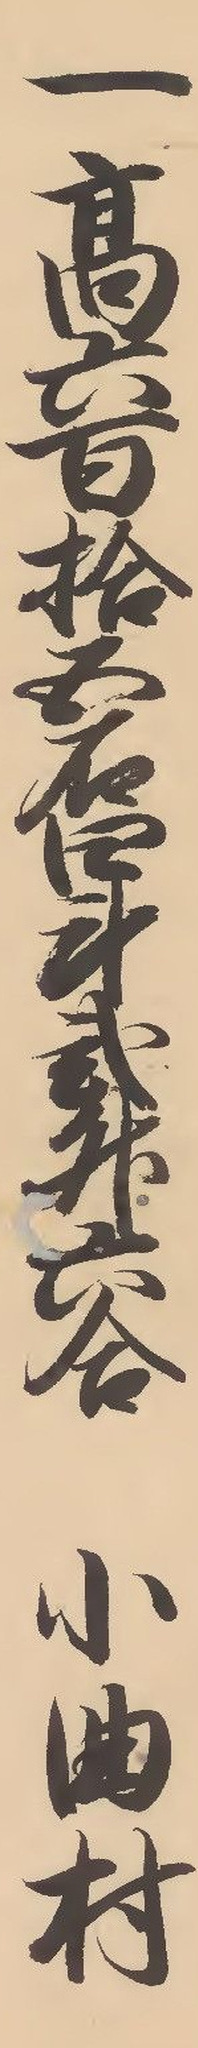一高六百拾五石四斗弐升六合小曲村
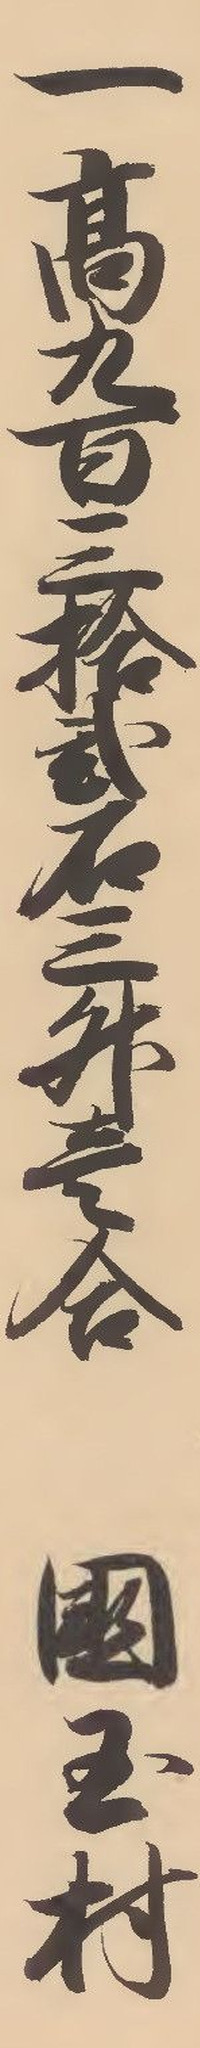一高九百三拾弐石三升壱合国玉村
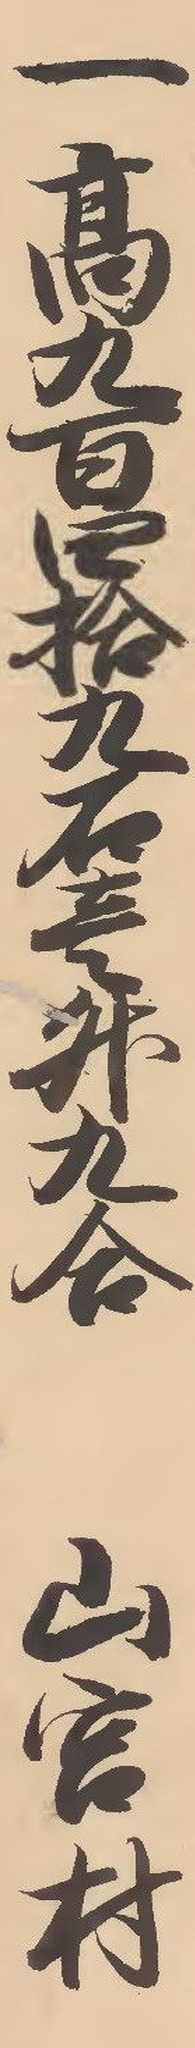一高九百四拾九石壱升九合山宮村
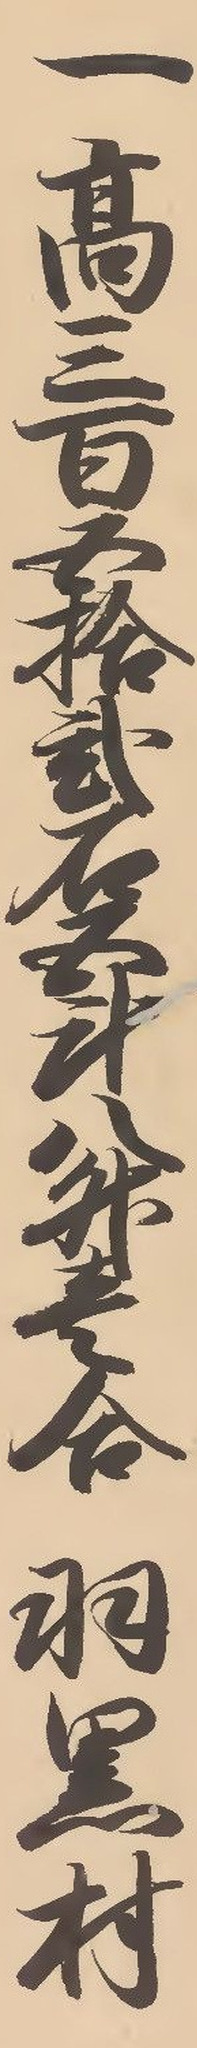一高三百五拾弐石五斗八升壱合羽黒村
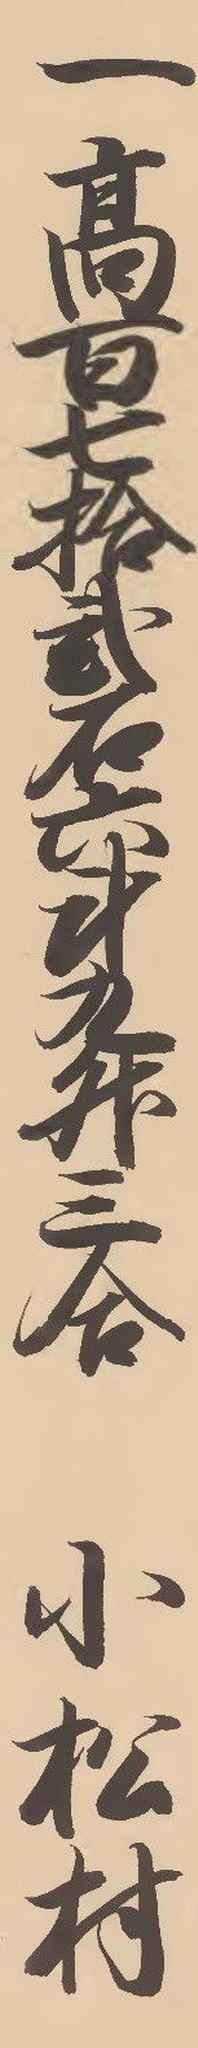一高百七拾弐石六斗九升三合小松村
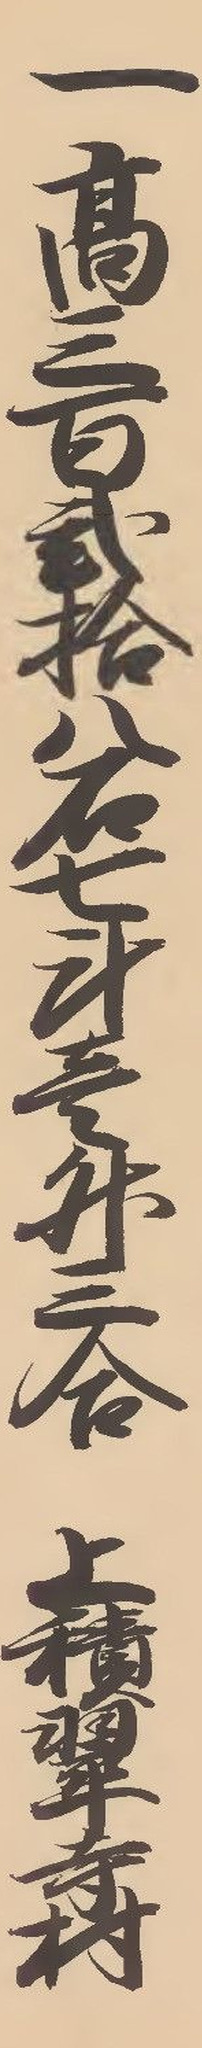一高三百弐拾八石七斗壱升三合上積翠寺村
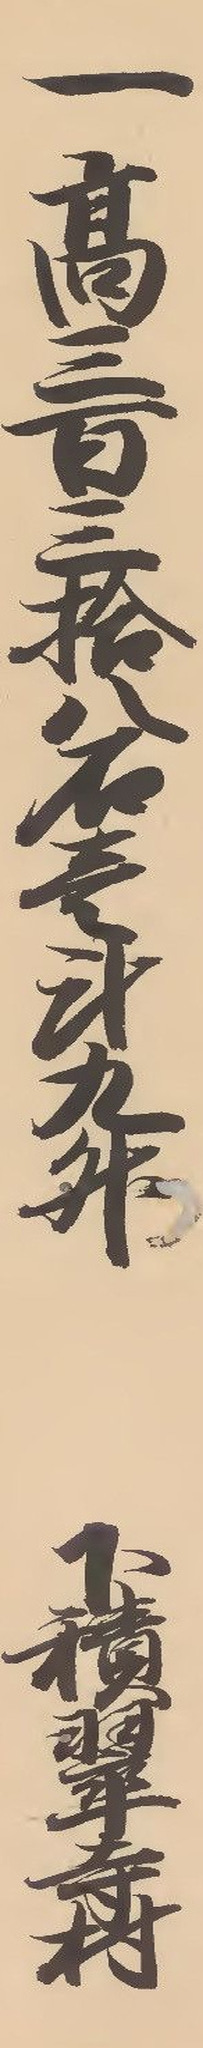一高三百三拾八石壱斗九升下積翠寺村

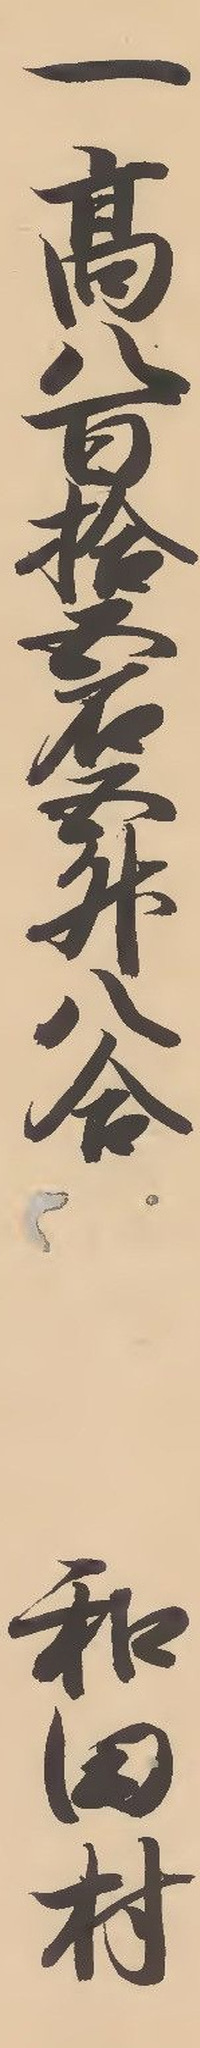一高八百拾五石五升八合和田村
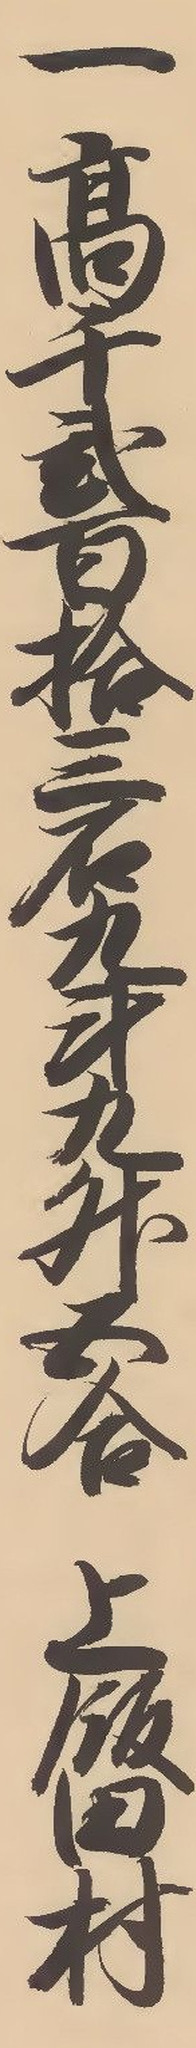一高千弐百拾三石九斗九升五合上飯田村
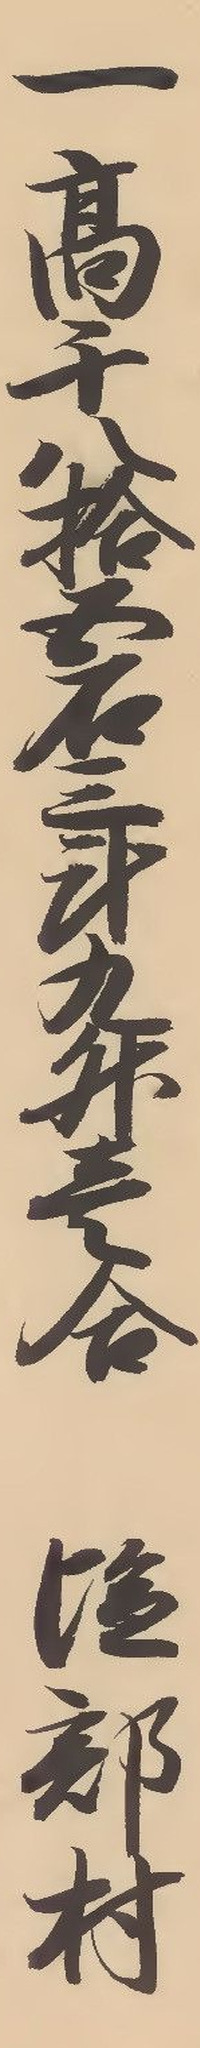一高千八拾五石三斗九升壱合塩部村
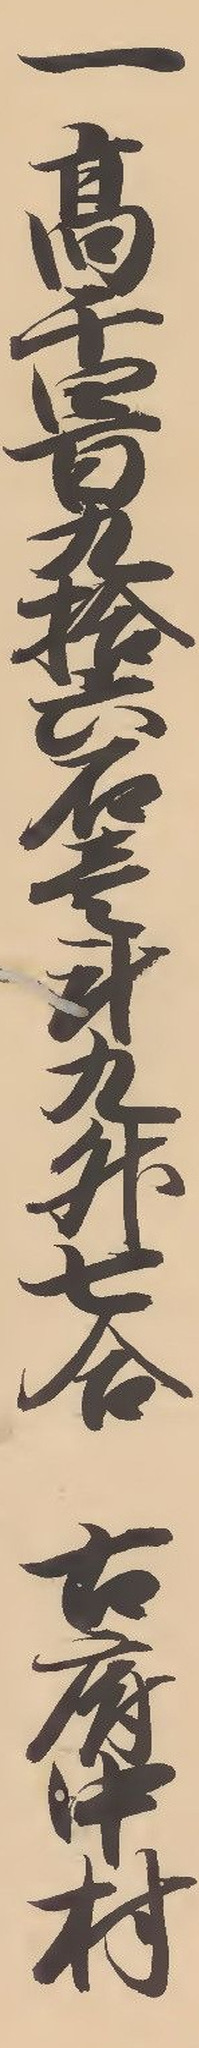一高千四百九拾六石壱斗九升七合古府中村
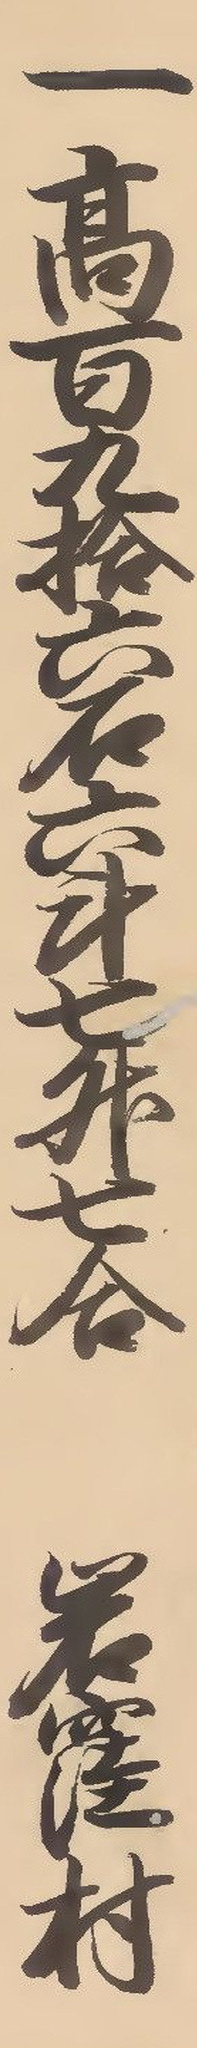一高百九拾六石六斗七升七合岩窪村
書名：甲斐国郷帳
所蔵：国立公文書館 National Archives of Japan
